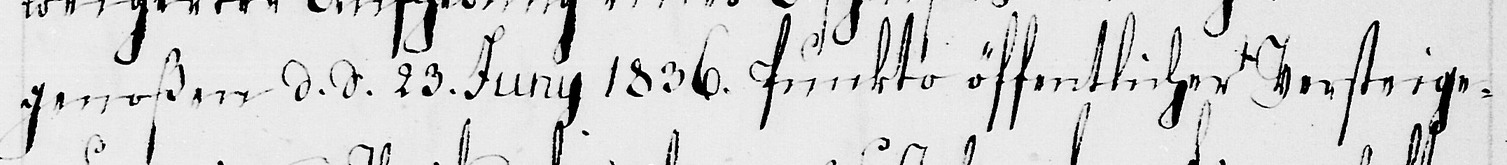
genoßen d. d. 23. Juny 1836 Punkto öffentlicher Versteige¬
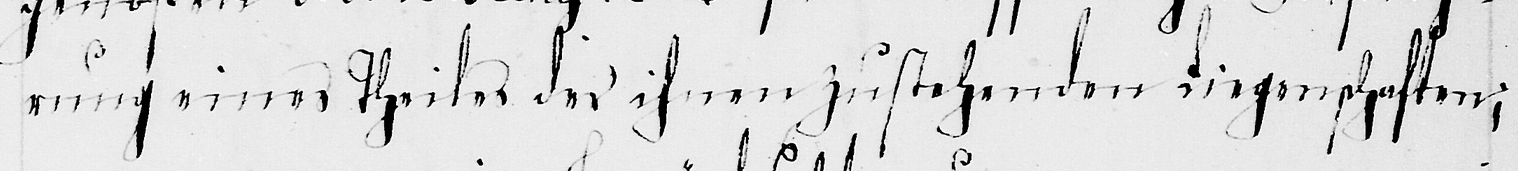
rung eines Theiles der ihnen zustehenden Liegenschaften;
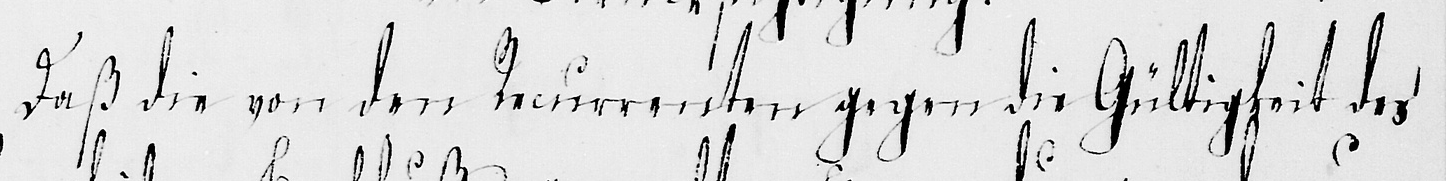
Daß die von den Recurrenten gegen die Gültigkeit des
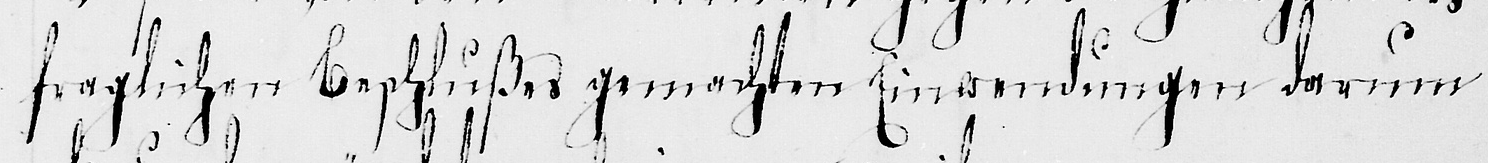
fraglichen Beschlußes gemachten Einwendungen darum
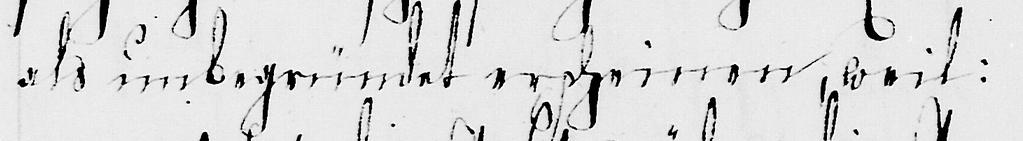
als unbegründet erscheinen, weil:
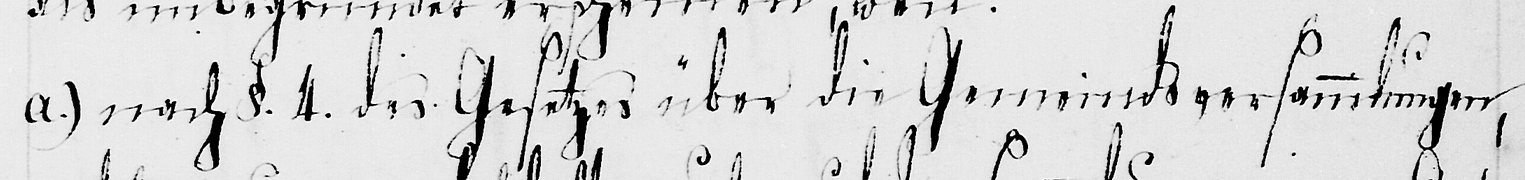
a.) nach §. 4. des Gesetzes über die Gemeindsversammlungen,
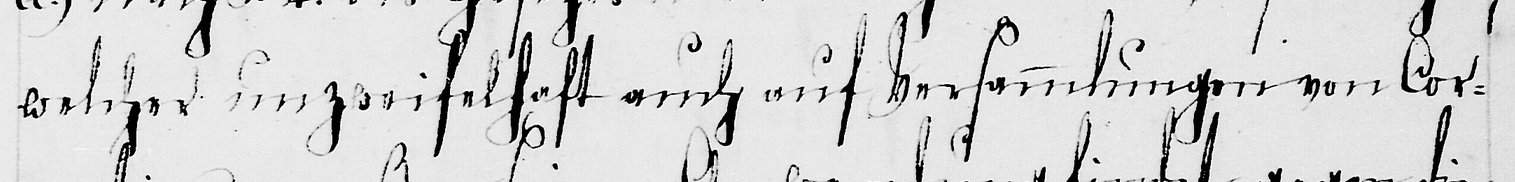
welcher unzweifelhaft auch auf Versammlungen von Cor¬
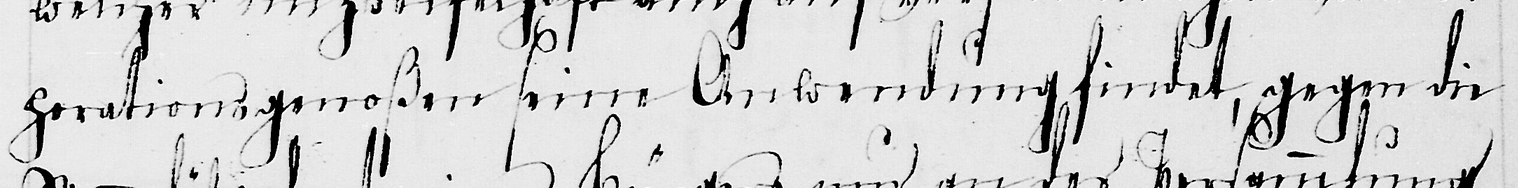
porationsgenoßen seine Anwendung findet, gegen die
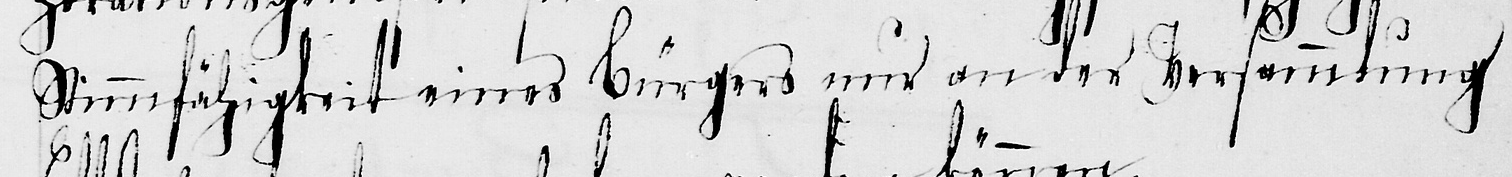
Stimmfähigkeit eines Bürgers nur an der Versammlung
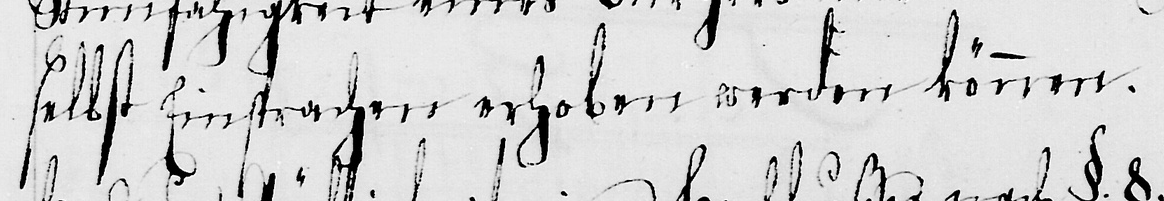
selbst Einsprachen erhoben werden können.
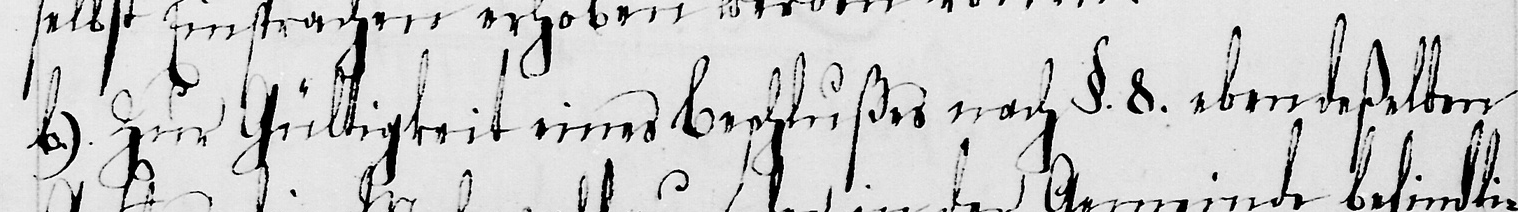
b.) Zur Gültigkeit eines Beschlußes nach §. 8. ebendeßelben
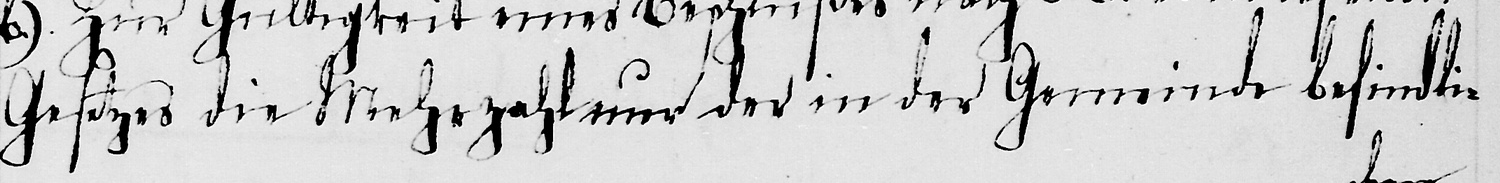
Gesetzes die Mehrzahl und der in der Gemeinde befindli-
